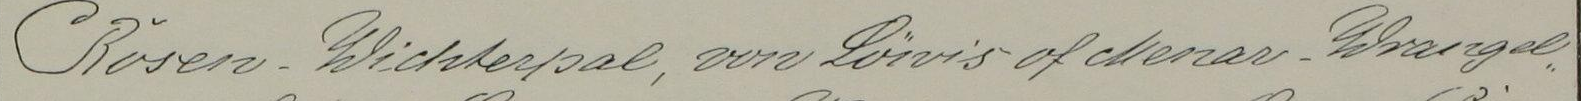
Rosen-Wichterpal, von Löwis of Menar-Wrangel-
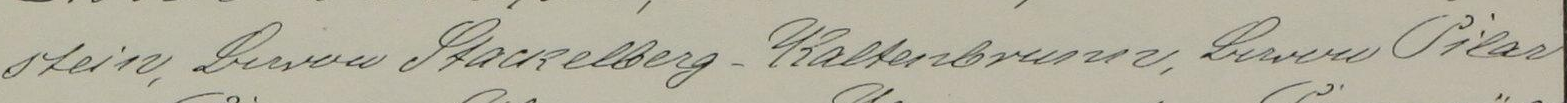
stein, Baron Stackelberg-Kaltenbrunn, Baron Pilar
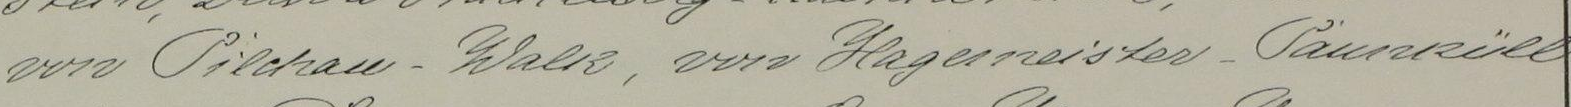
von Pilchau-Walk, von Hagemeister-Paunküll
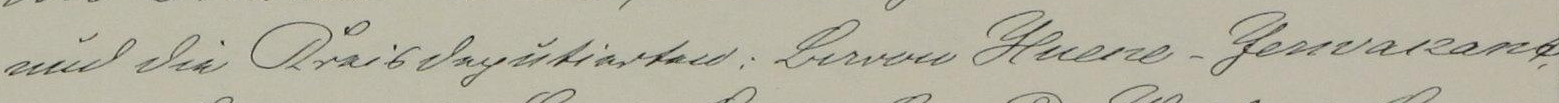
und die Kreisdeputierten: Baron Huene-Jerwakant,
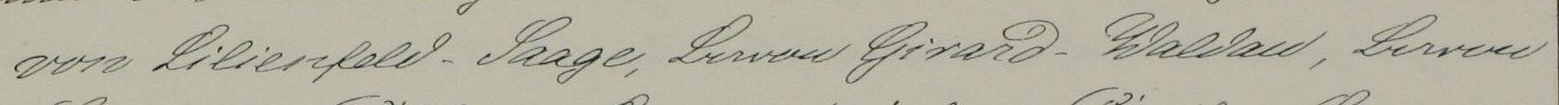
von Lilienfeld-Saage, Baron Girard-Waldau, Baron
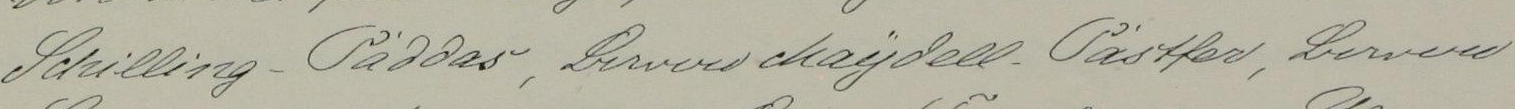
Schilling-Paddas, Baron Maydell-Pastfer, Baron
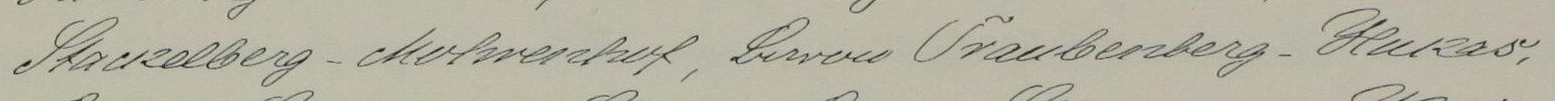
Stackelberg-Mohrenhof, Baron Traubenberg-Hukas,
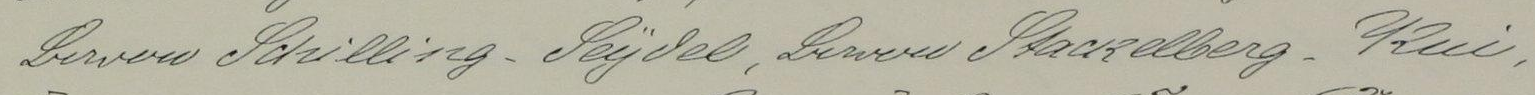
Baron Schilling-Seydel, Baron Stackelberg-Kui,
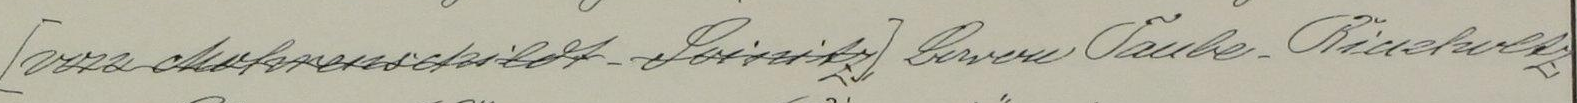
[von Mohrenschildt-Soinitz], Baron Taube-Rickholtz,
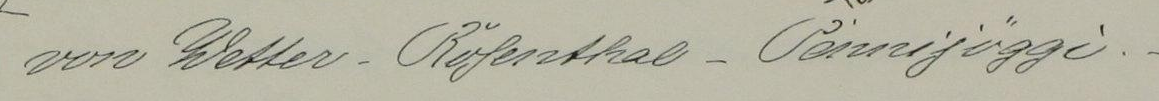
von Wetter-Rosenthal-Pennijöggi.
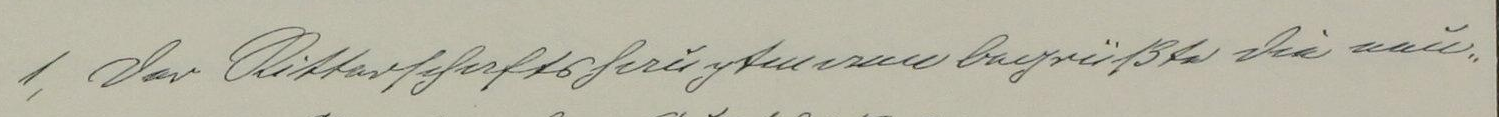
1. Der Ritterschaftshauptmann begrüßte die neu-
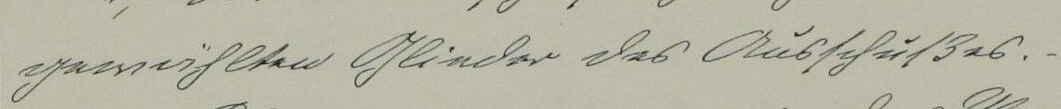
gewählten Glieder des Ausschußes.
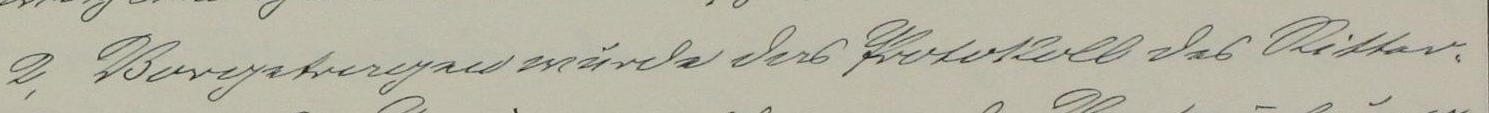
2. Vorgetragen wurde das Protokoll des Ritter-
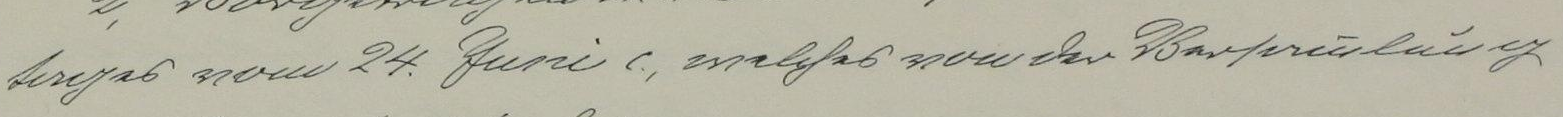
tages vom 24. Juni c., welches von der Versammlung
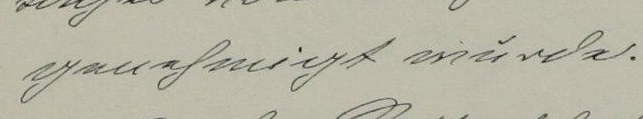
genehmigt wurde.
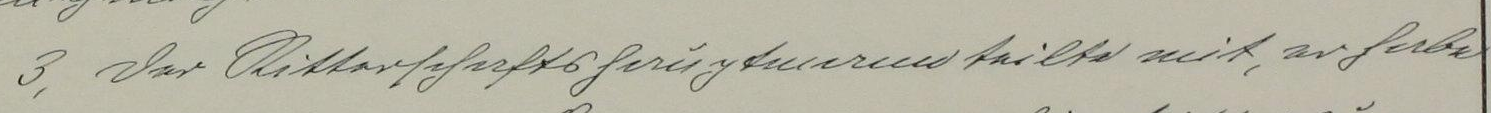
3. Der Ritterschaftshauptmann teilte mit, er habe
